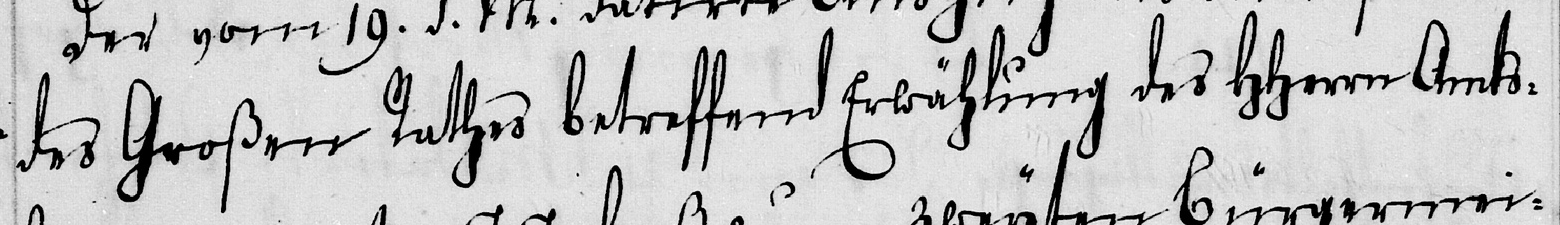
des Großen Rathes betreffend Erwählung des HHerrn Amts¬
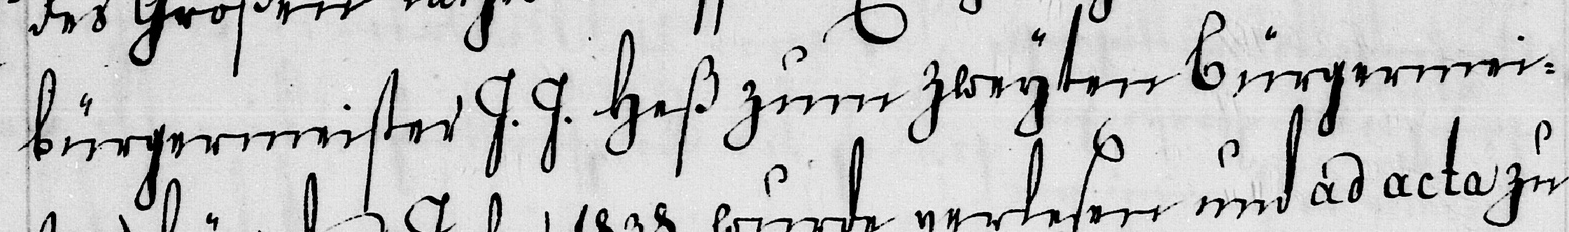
bürgermeister J. J. Heß zum zweyten Bürgermei¬
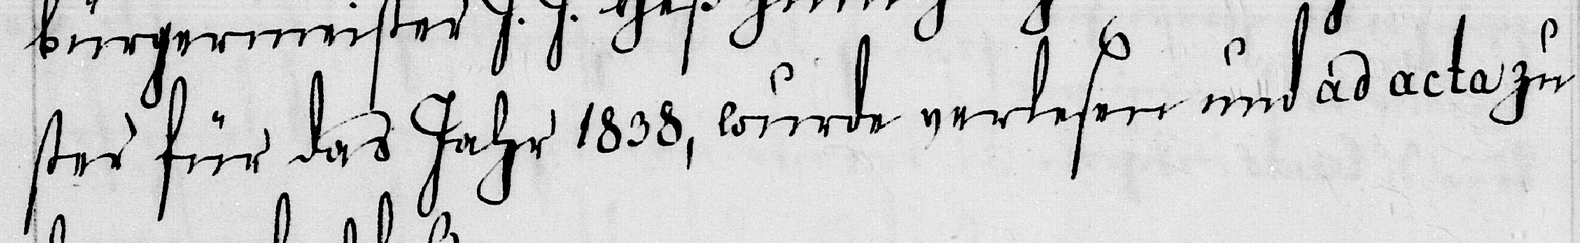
ster für das Jahr 1838, wurde verlesen und ad acta zu
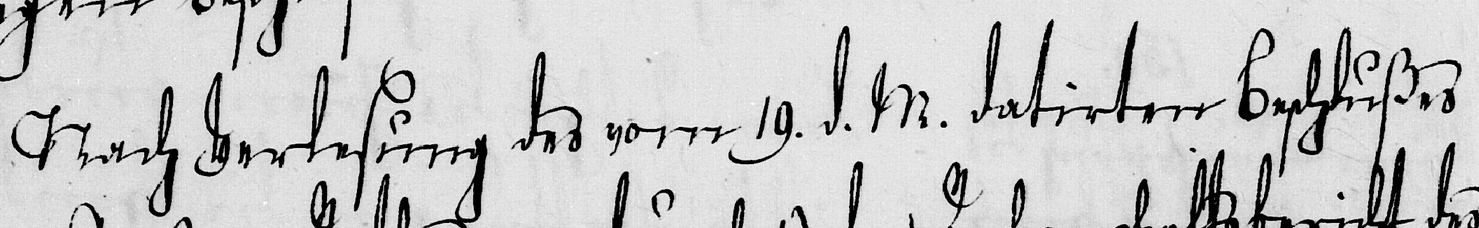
Nach Verlesung des vom 19. d. M. datirten Beschlußes
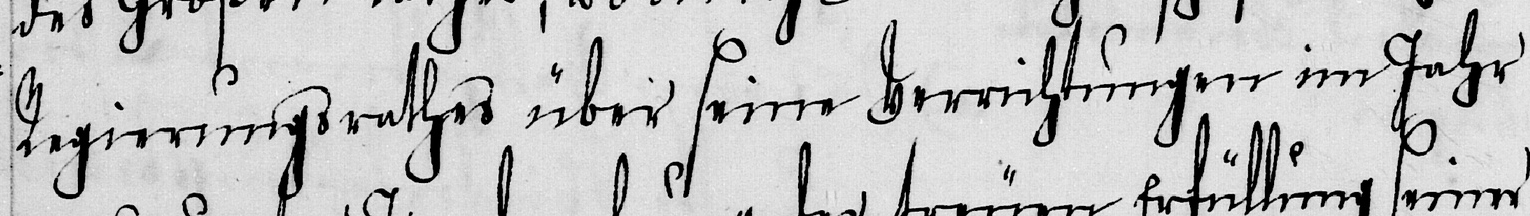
Regierungsrathes über seine Verrichtungen im Jahr
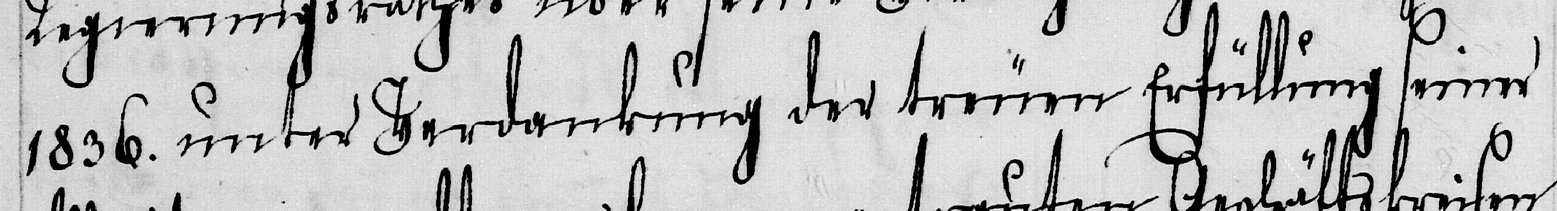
1836. unter Verdankung der treuen Erfüllung seiner
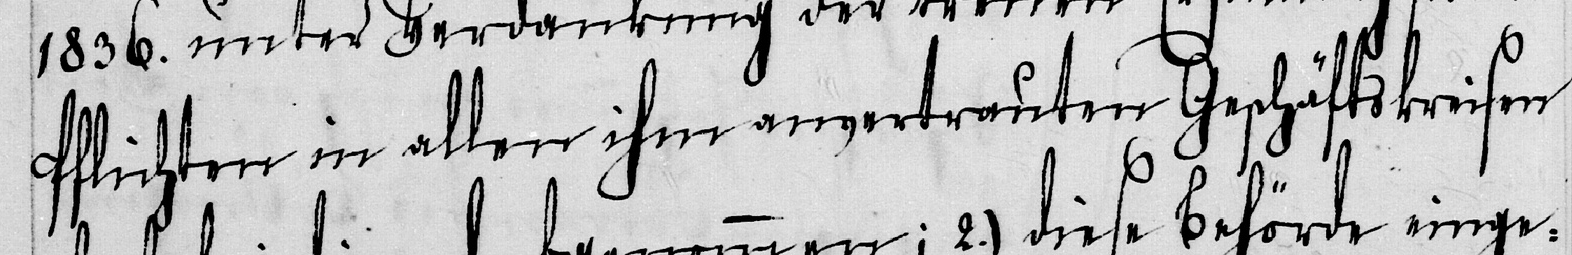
Pflichten in allen ihm anvertrauten Geschäftskreisen
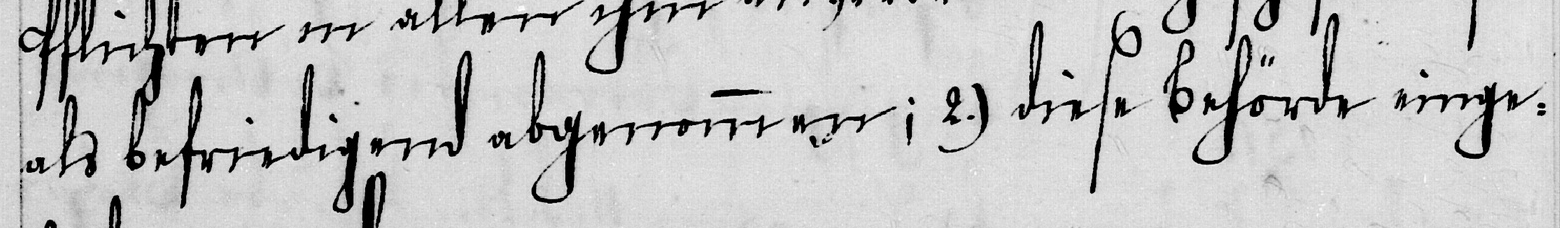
als befriedigend abgenommen; 2.) diese Behörde einge¬
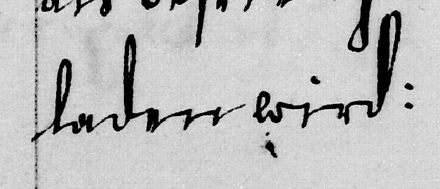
laden wird:
